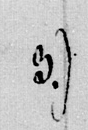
3.)
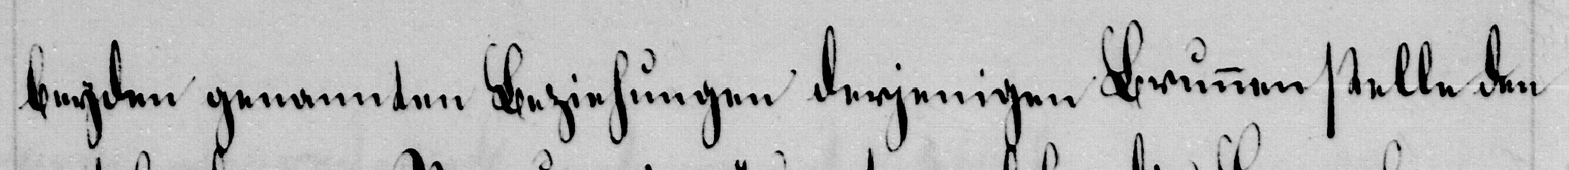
beyden genannten Beziehungen derjenigen Brunnenstelle den
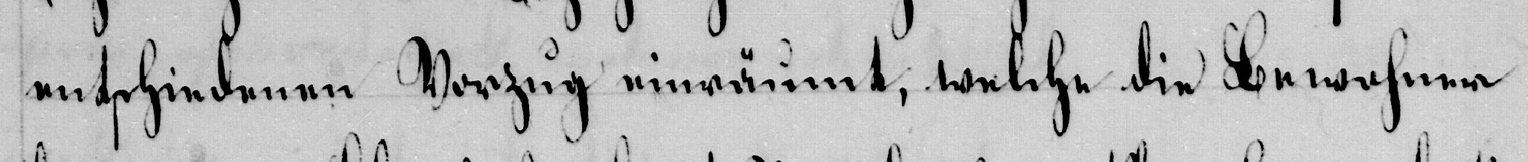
entschiedenen Vorzug einräumt, welche die Bewohner
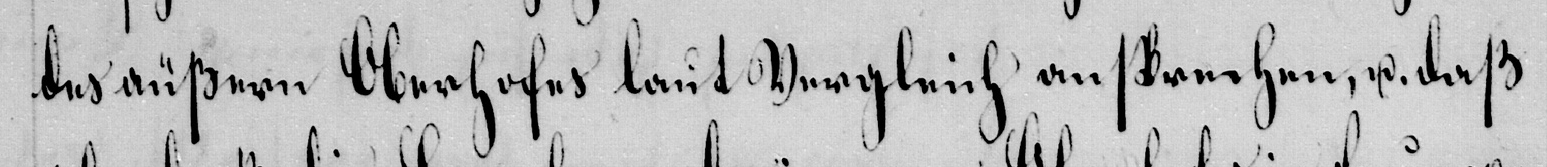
des äußern Oberhofes laut Vergleich ansprechen, u. daß
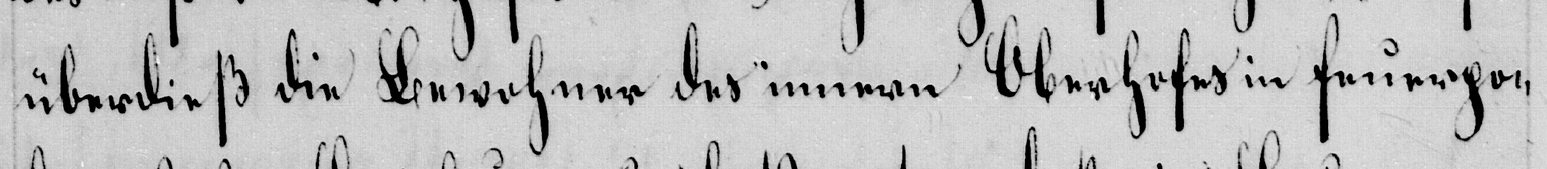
überdieß die Bewohner des innern Oberhofes in feuerpo¬
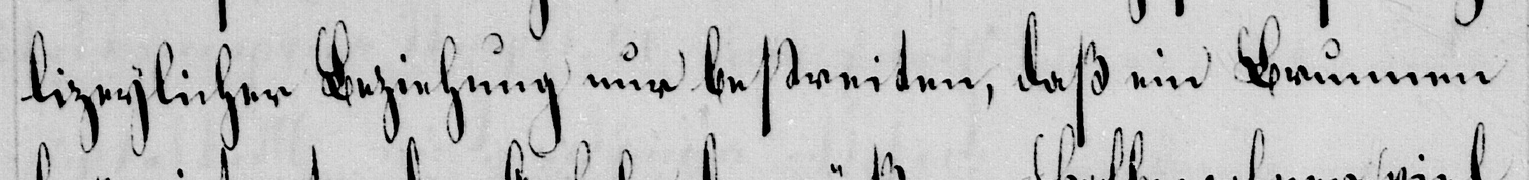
lizeylicher Beziehung nur bestreiten, daß ein Brunnen
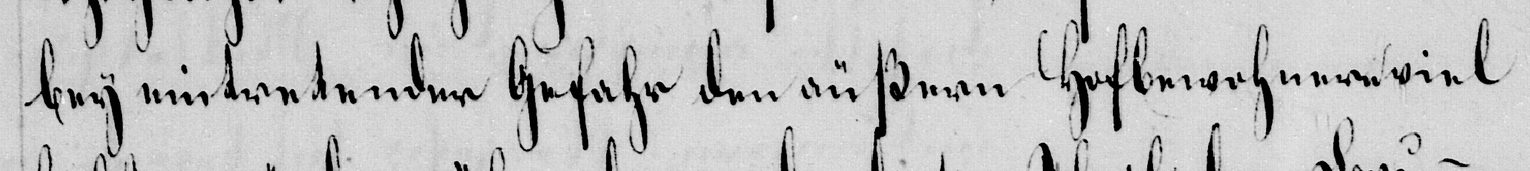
bey eintretender Gefahr den äußern Hofbewohnern viel
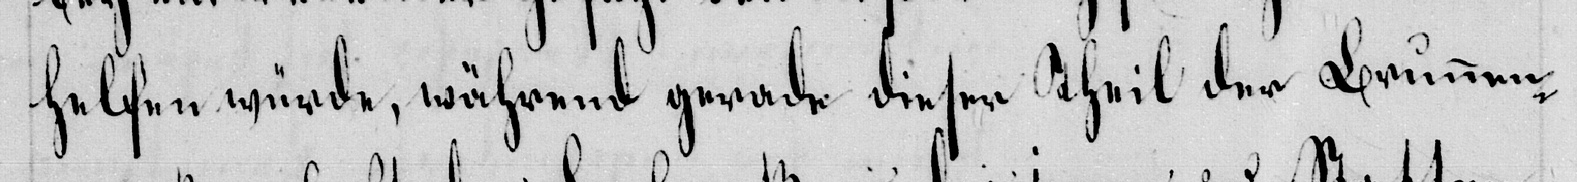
helfen würde, während gerade dieser Theil der Brunnen¬
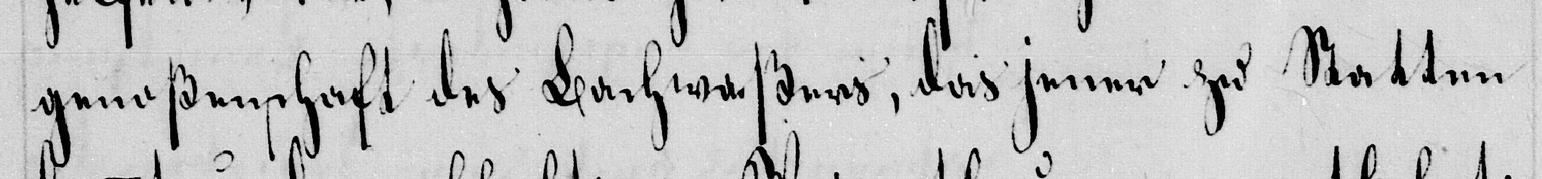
genoßenschaft des Bachwaßers, das jener zu Statten
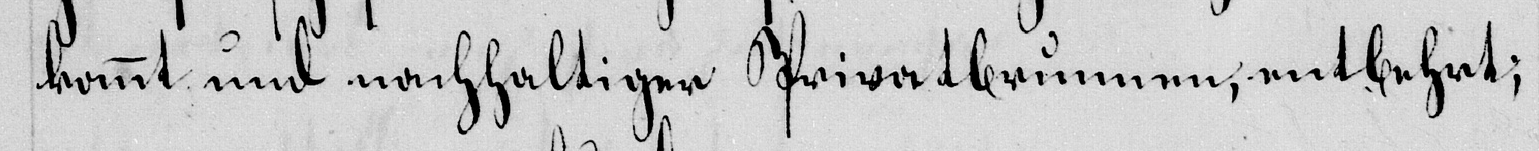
kommt und nachhaltiger Privatbrunnen, entbehrt;
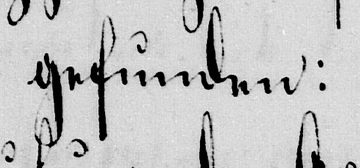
gefunden:
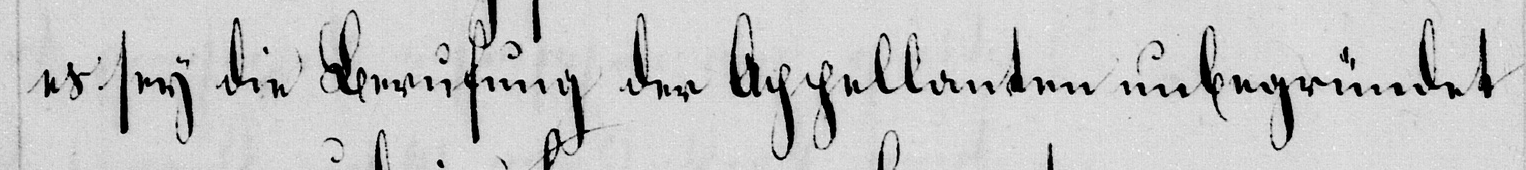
es sey die Berufung der Appellanten unbegründet
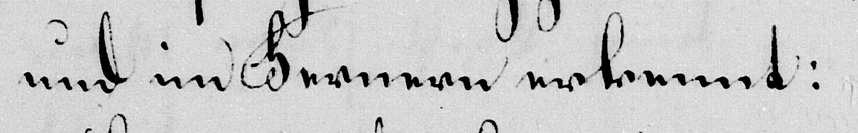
und im Fernern erkannt:
